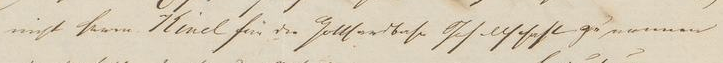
nicht Herrn Kinel für die Gotthardbahn Gesellschaft zu nennen
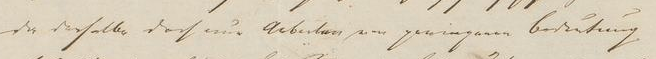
da derselbe doch nur Arbeiten von geringerer Bedeutung
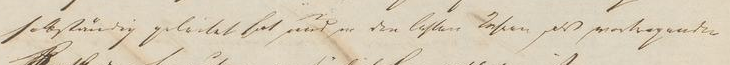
selbständig geleitet hat und in den letzten Jahren als vortragender
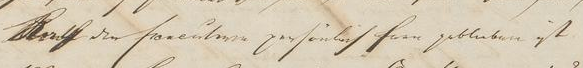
Rath der Executive persönlich fern geblieben ist.
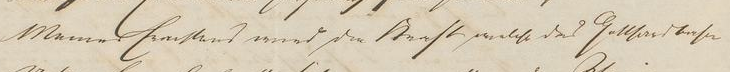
Meines Erachtens wird die Kraft welche das Gotthardbahn
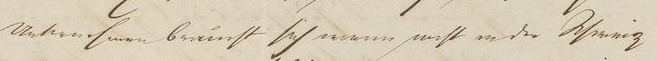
Unternehmen braucht sich wenn nicht in der Schweiz
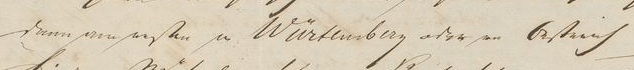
dann am eesten in Würtemberg oder in Oestreich
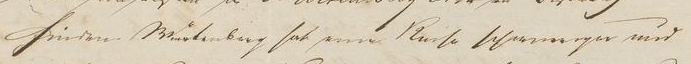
finden. Würtenberg hat eine Reihe schwieriger und
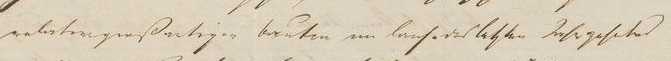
relativ großartiger Bauten im Laufe des letzten Jahrzehntes
